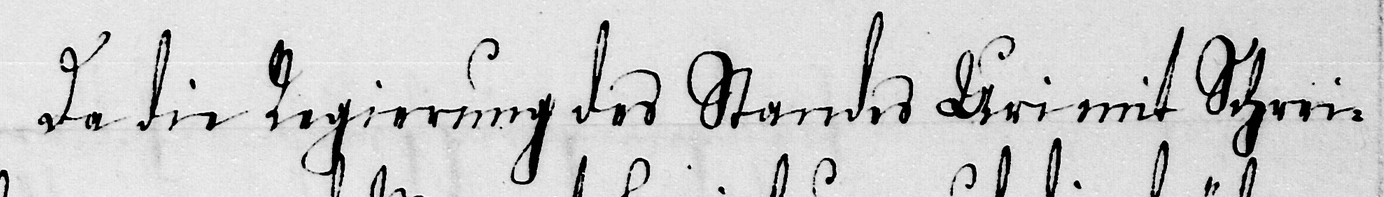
Da die Regierung des Standes Uri mit Schrei¬
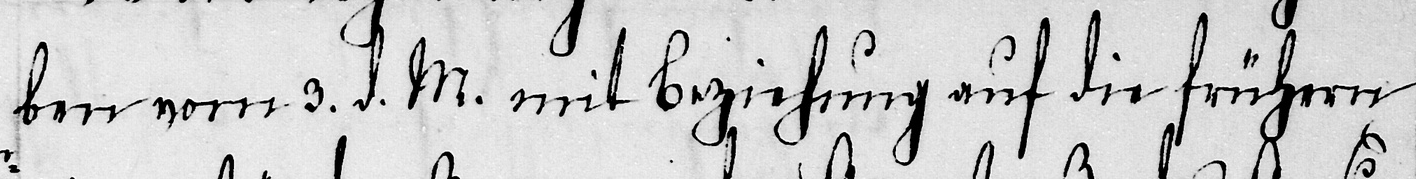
ben vom 3. d. M. mit Beziehung auf die frühren
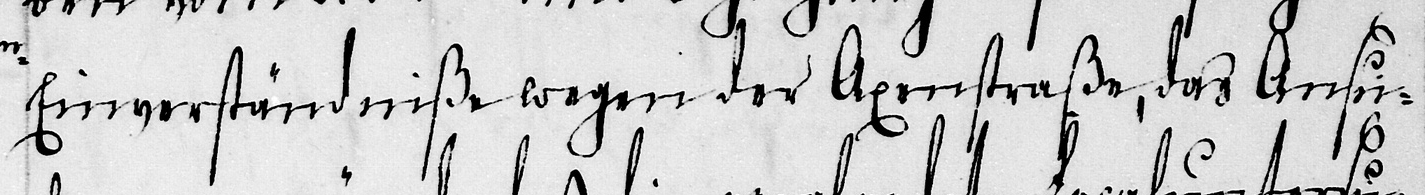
Einverständniße wegen der Axenstraße, das Ansu¬
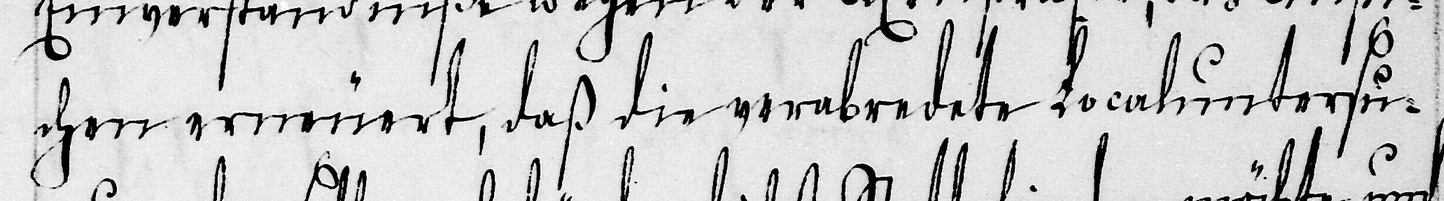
chen erneuert, daß die verabredete Localuntersu¬
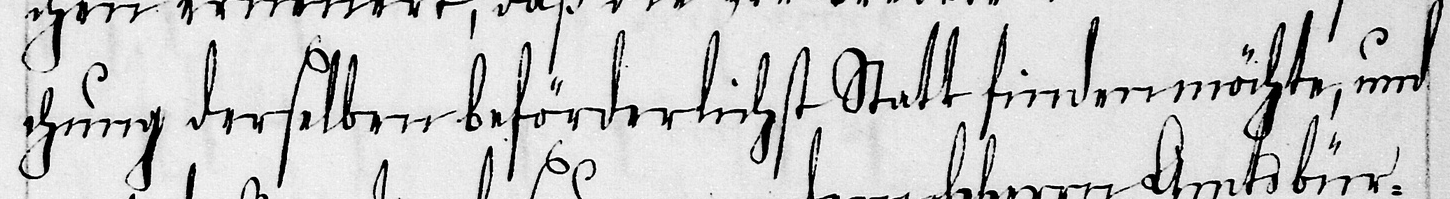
chung derselben beförderlichst Statt finden möchte, und
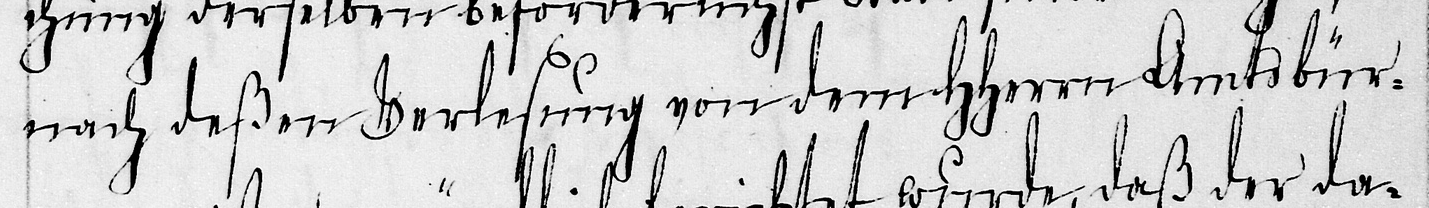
nach deßen Verlesung von dem HHerrn Amtsbür¬
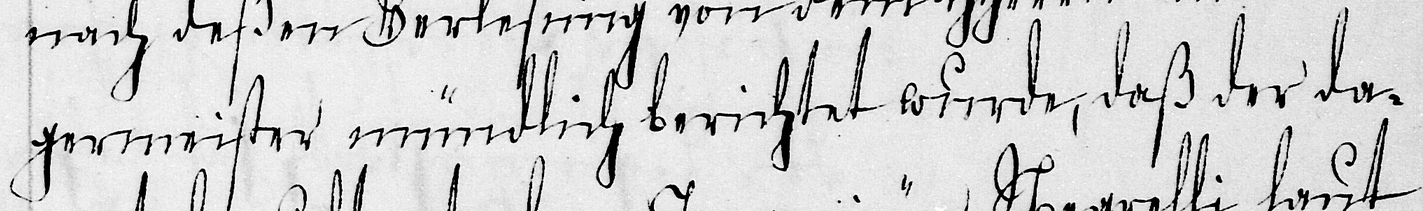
germeister mündlich berichtet wurde, daß der da¬
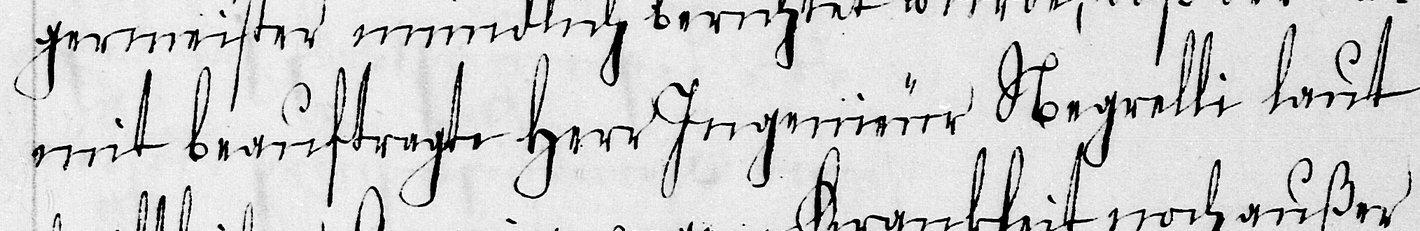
mit beauftragte Herr Ingenieur Negrelli laut
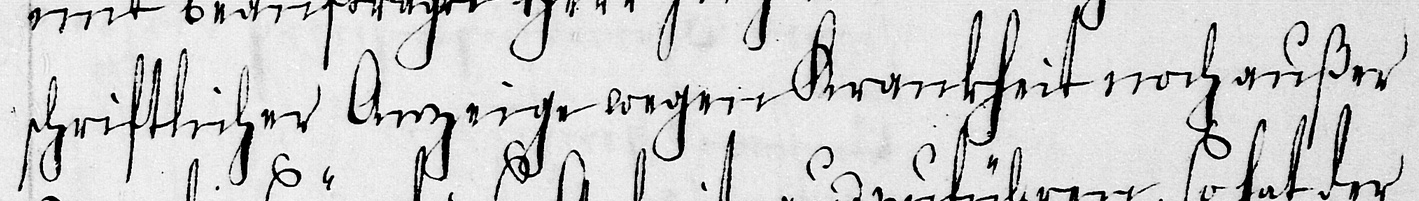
schriftlicher Anzeige wegen Krankheit noch außer
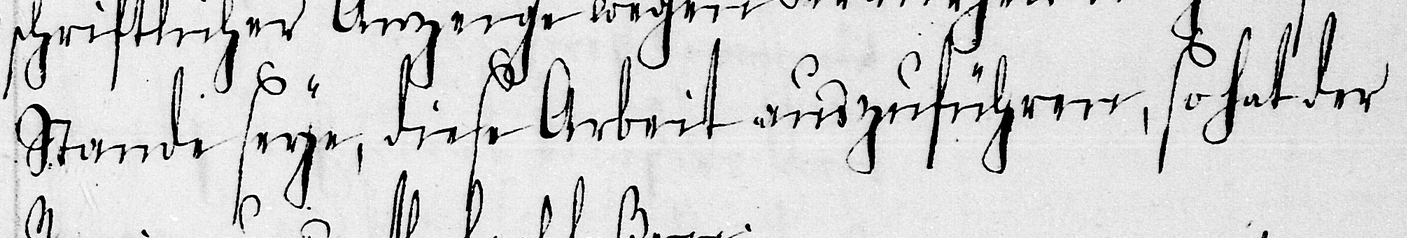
Stande seye, diese Arbeit auszuführen, so hat der
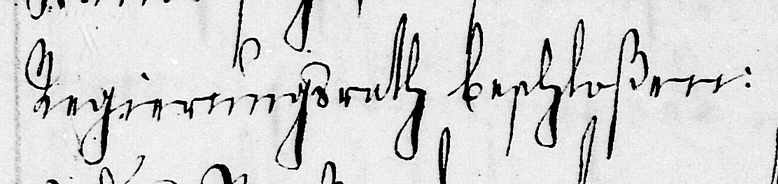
Regierungsrath beschloßen:
